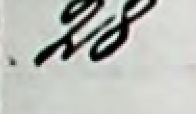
28
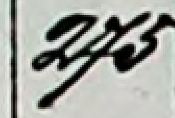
275
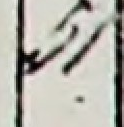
51
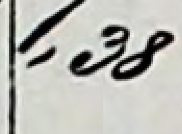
1,38
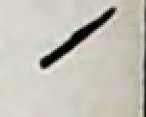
1
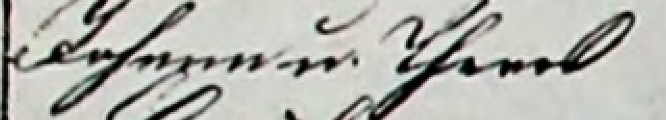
Johann u. Theres
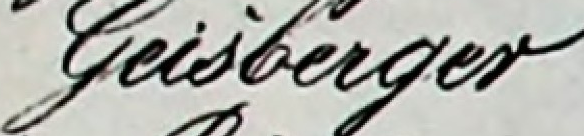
Geisberger
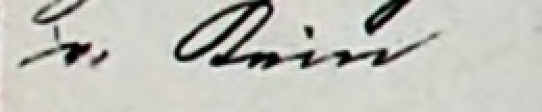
v. Kein
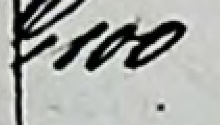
0,100
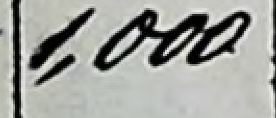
1,000
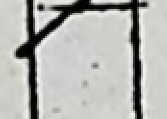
7
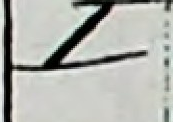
I
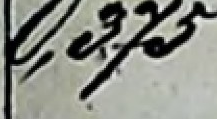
0,375
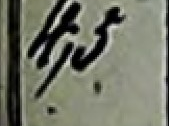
4,5
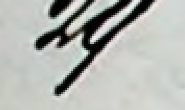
29
